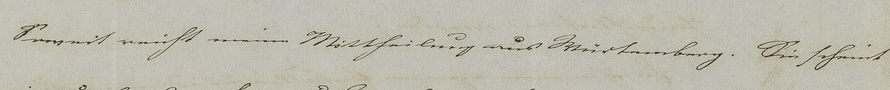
Soweit reicht meine Mittheilung aus Würtemberg. Sie scheint
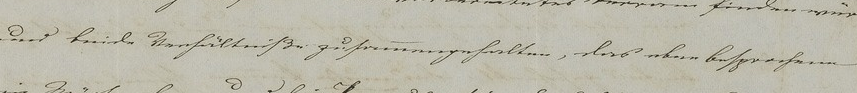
und beide Verhältniße zusammengehalten, das eben Besprochene
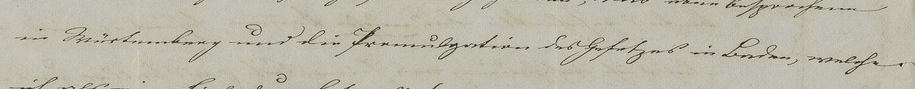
in Würtemberg und die Promulgation des Gesetzes in Baden, welche
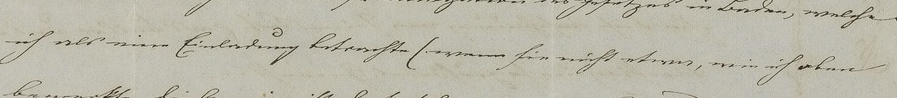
ich als eine Einladung betrachte (wenn sie nicht etwa, wie ich oben
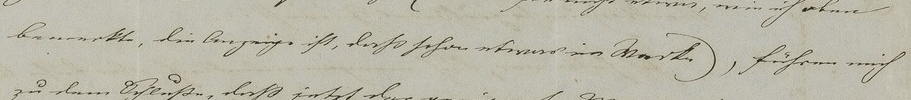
bemerkte, die Anzeige ist, daß schon etwas im Werke), führen mich
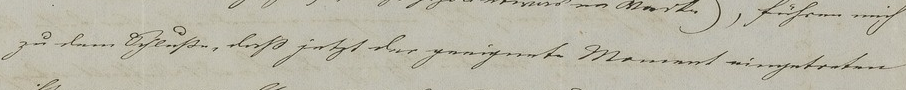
zu dem Schluße, daß jetzt der geeignete Moment eingetreten
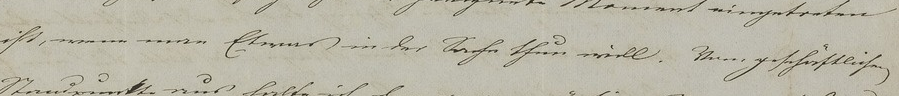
ist, wenn man Etwas in der Sache thun will. Vom geschäftlichen
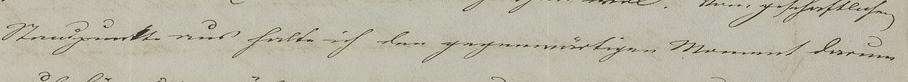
Standpunkte aus halte ich den gegenwärtigen Moment darum
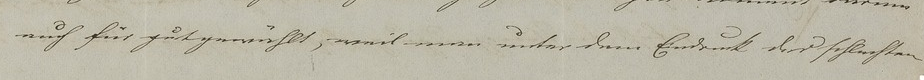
auch für gutgewählt, weil man unter dem Eindruck der schlechten
